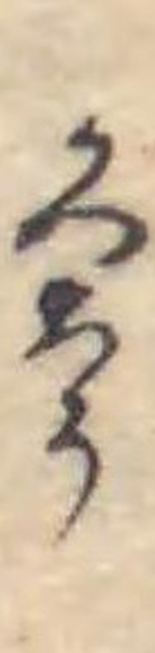かへろう
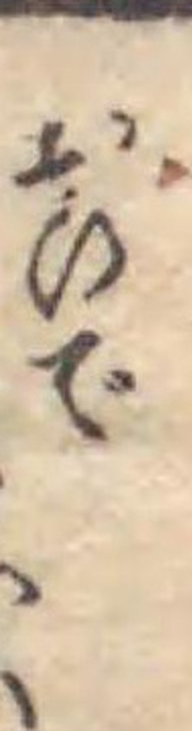おひで
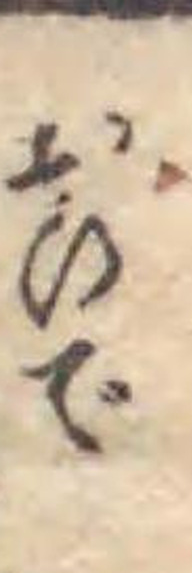おひで
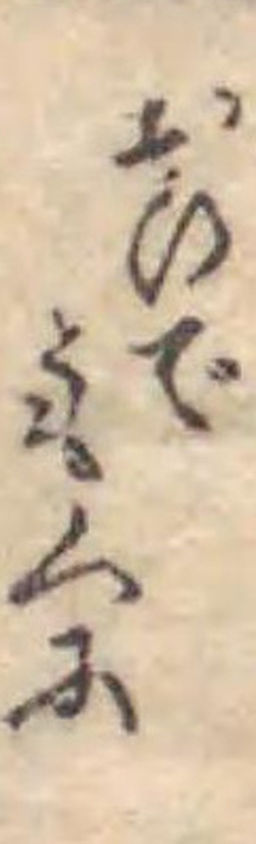とも人に
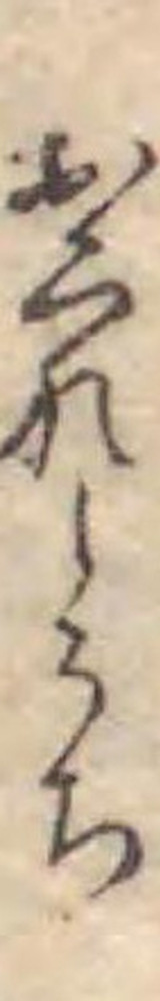おくれしうち
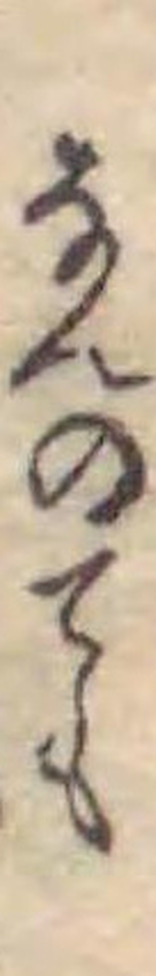なんのても
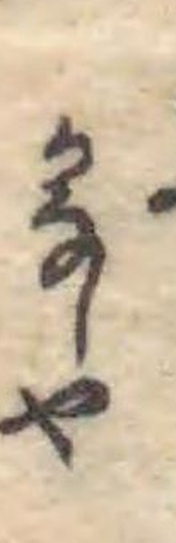かなしや
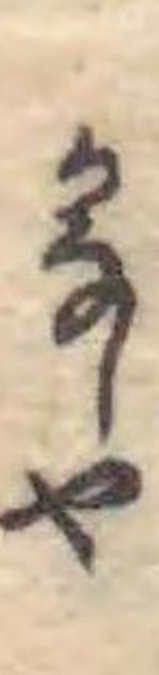かなしや
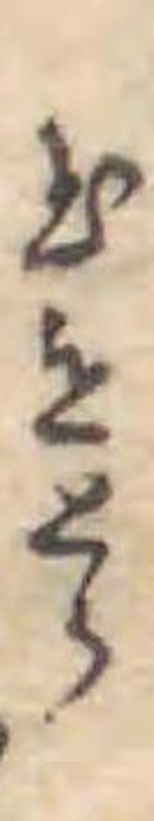玉をとら

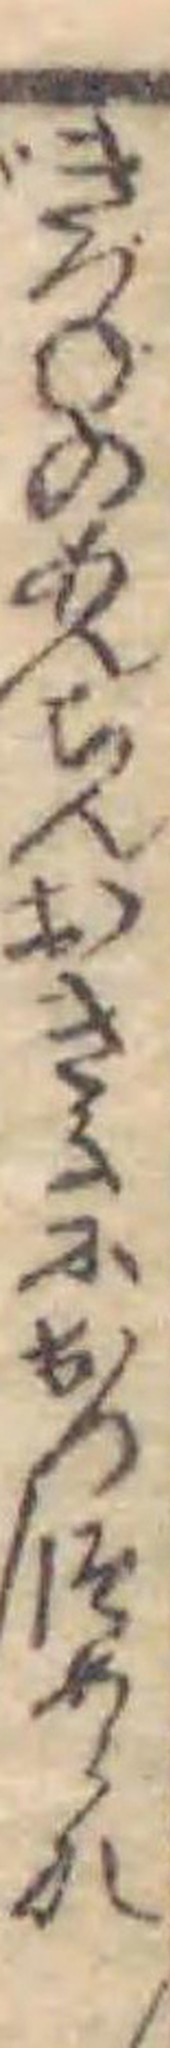きつねのあんちんおきなにおつつめられ
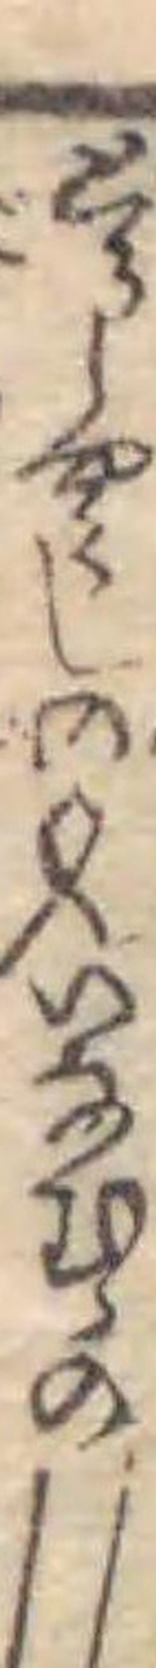どうしやうしのもんいなむらの
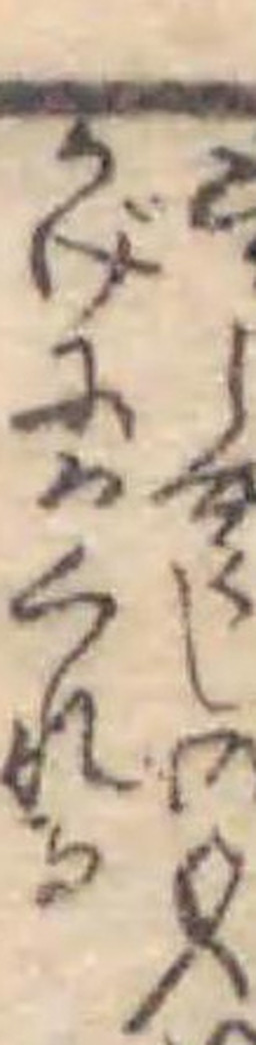かげにかくれる
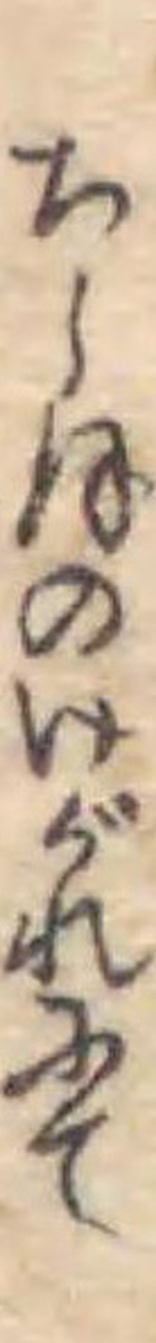ちしほのけがれにて
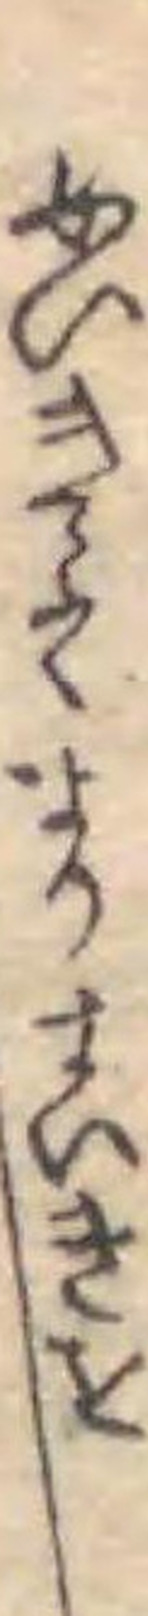女はきよくなりすいきを
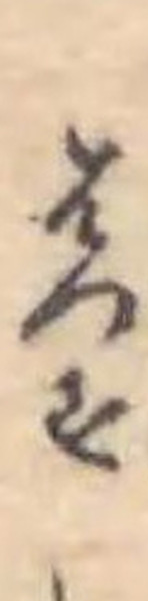はつす
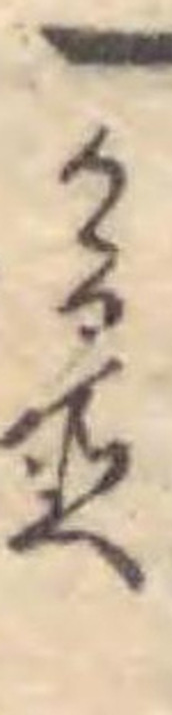かゝる所へ
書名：鐘入七人化粧 : 3巻
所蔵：国立国会図書館 National Diet Library, JAPAN
